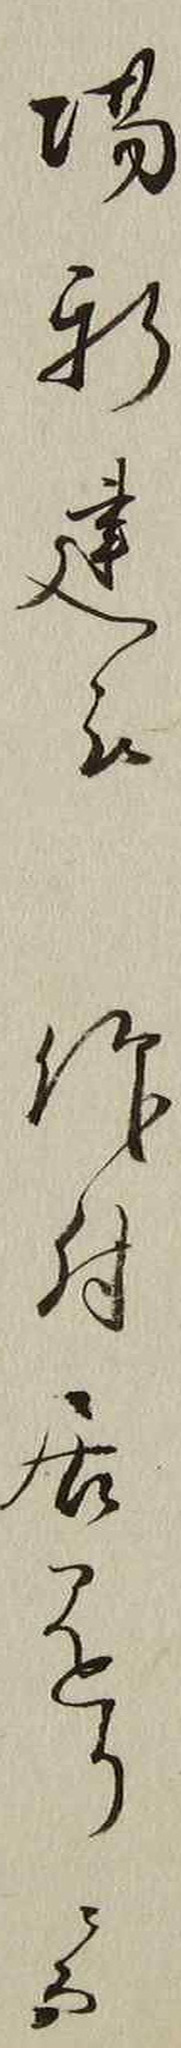場新建被仰付居懸りニ而
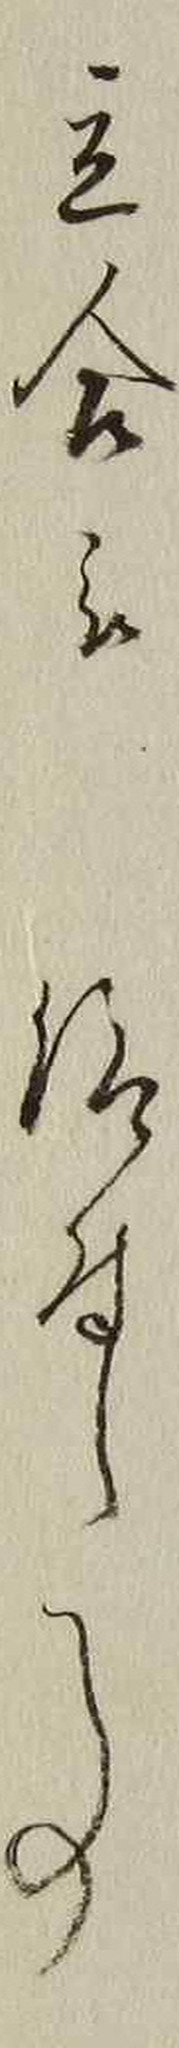立合被仰付候事
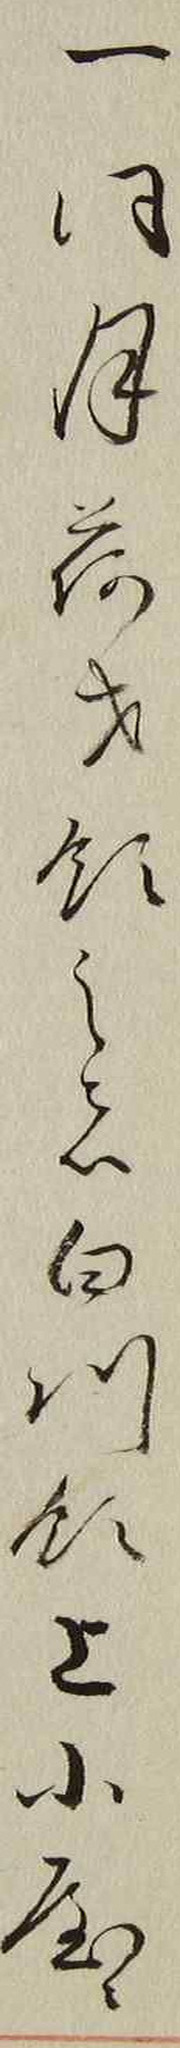一同月荷才領之者白川領上小屋ニ
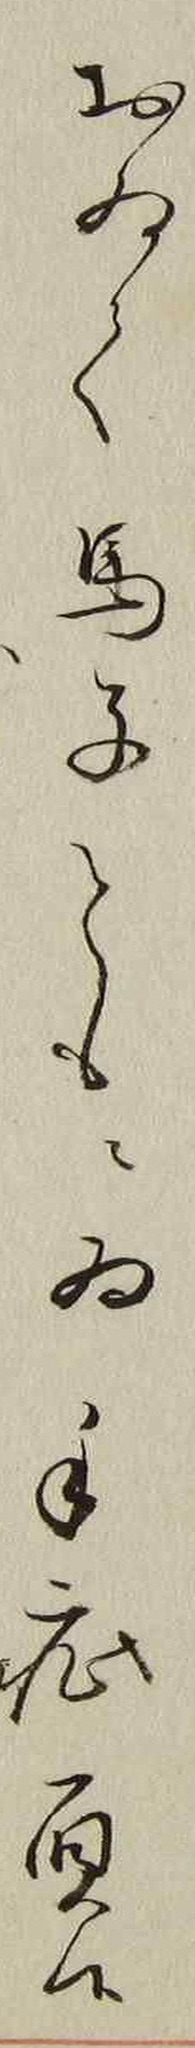おゐて馬子ともニ為手疵為負候
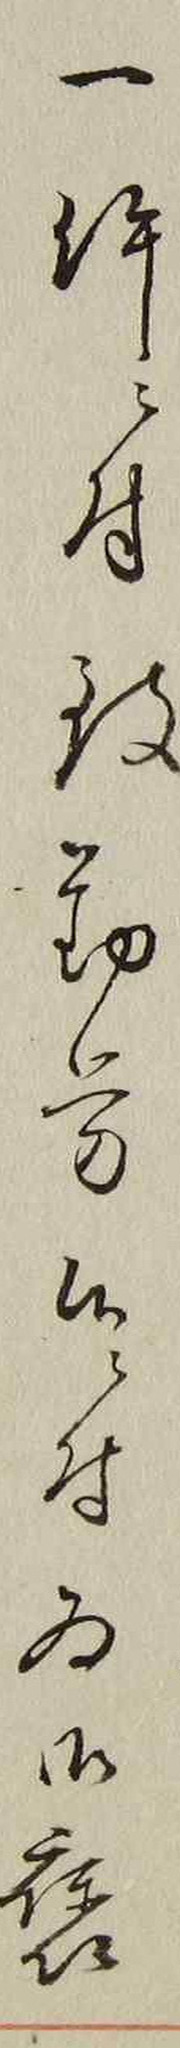一件ニ付致勤労候ニ付為御褒
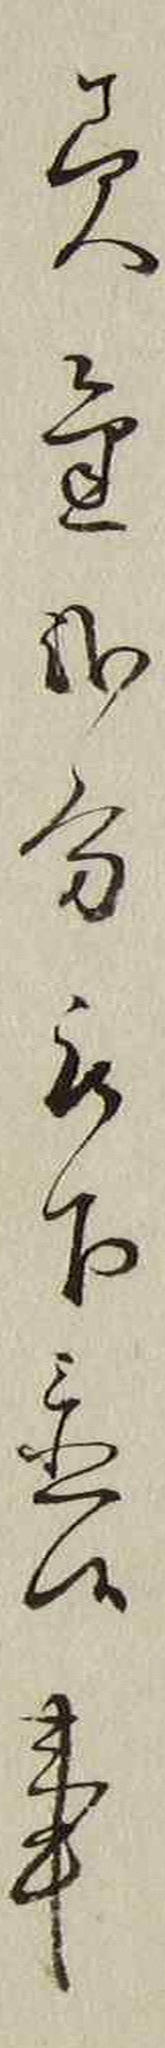美金弐分被下置候事
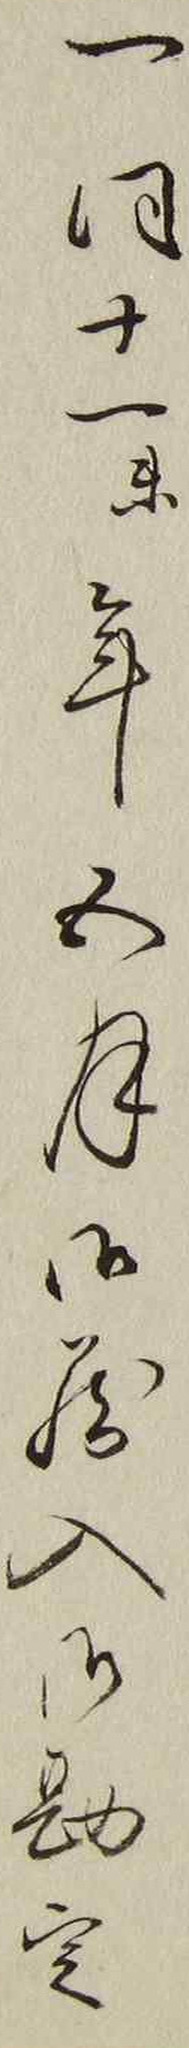一同十一未年五月御蔵入御勘定
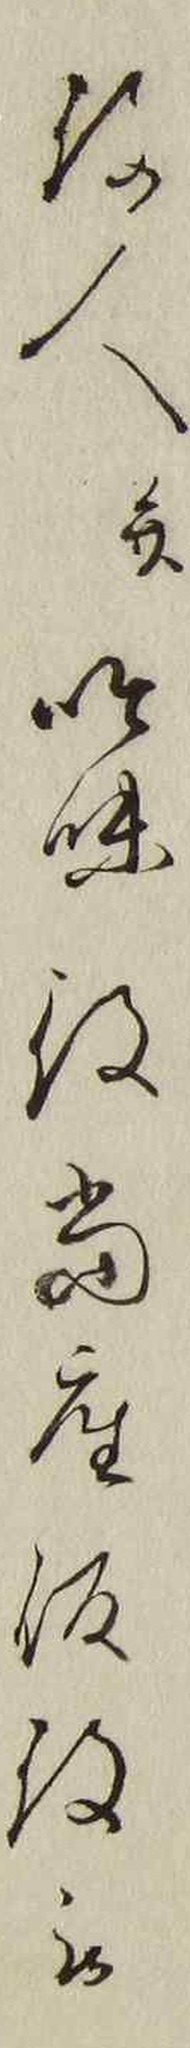役人并吟味役当座仮役被

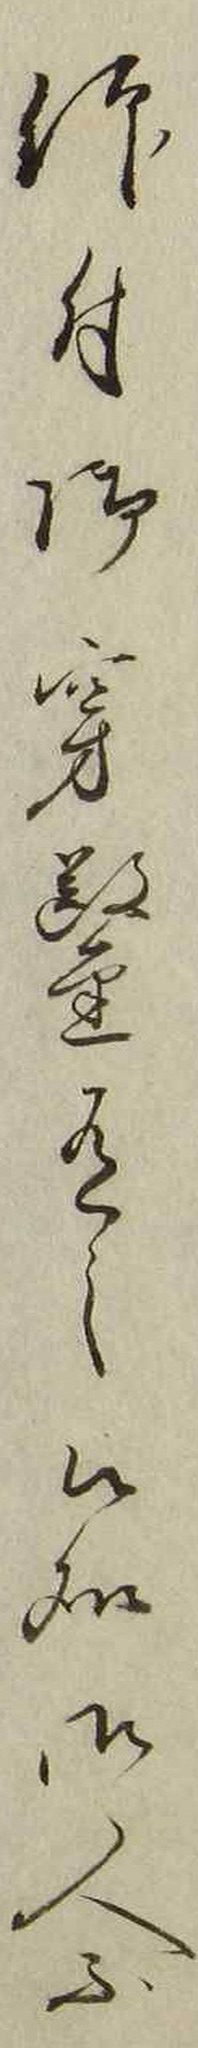仰付御穿鑿有之候所御人不
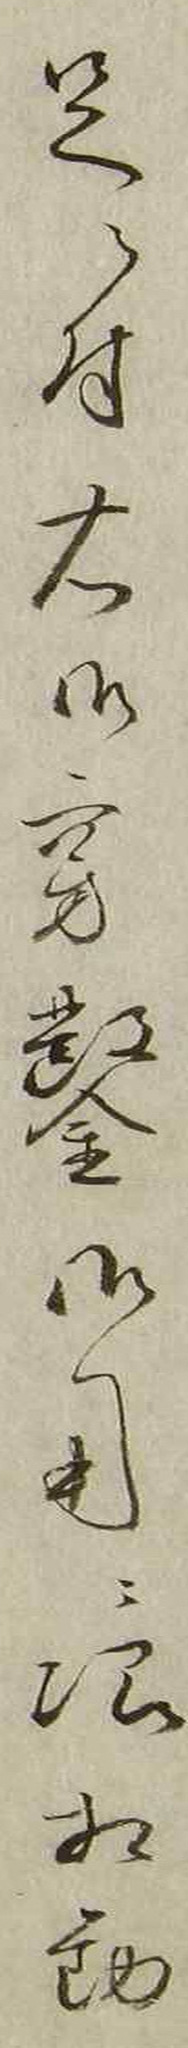足ニ付右御穿鑿御用ニ限相勤
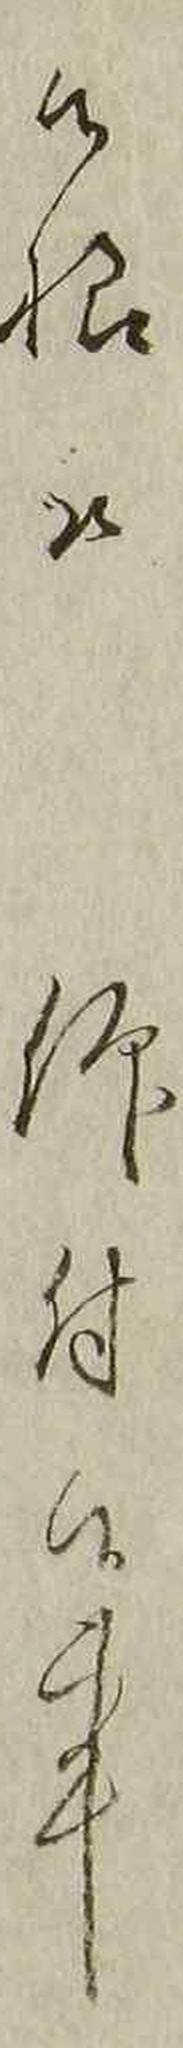候様被仰付候事
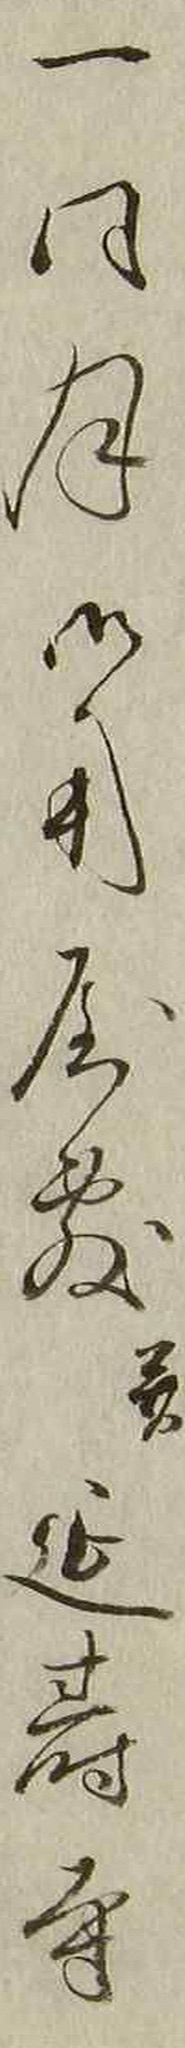一同月御用屋敷并延寿寺
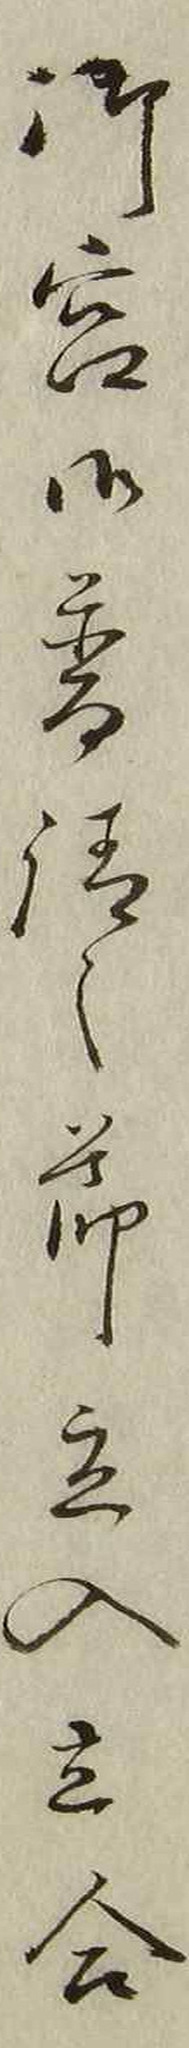御宮御普請之節立入立合
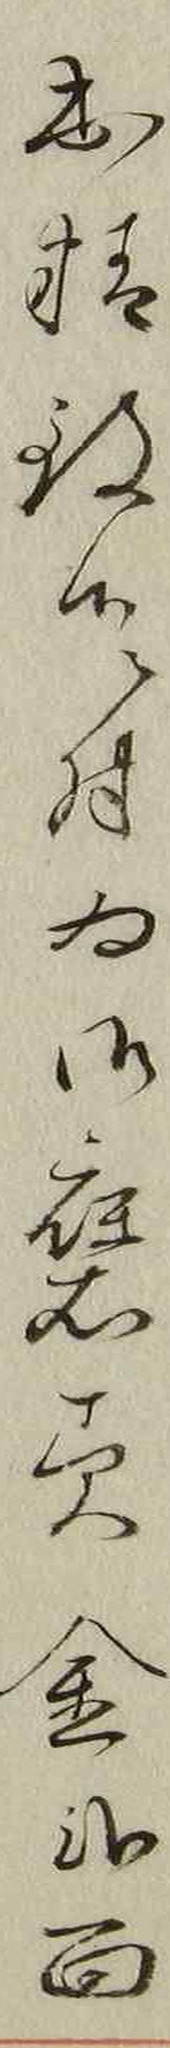出精致候ニ付為御褒美金弐百
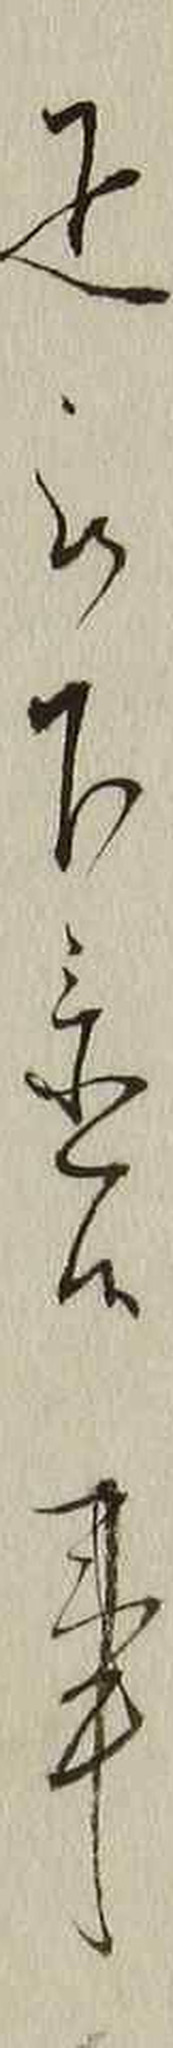疋被下置候事
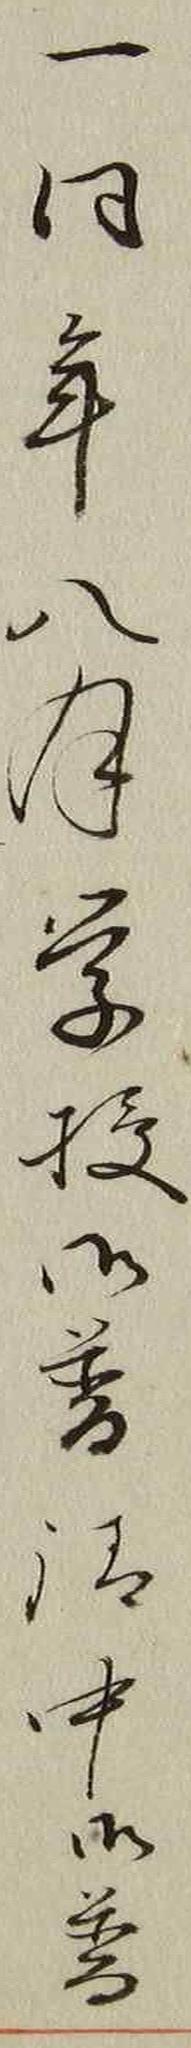一同年八月学校御普請中御普
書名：諸士系譜　巻之8　い之部8
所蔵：会津若松市立会津図書館
